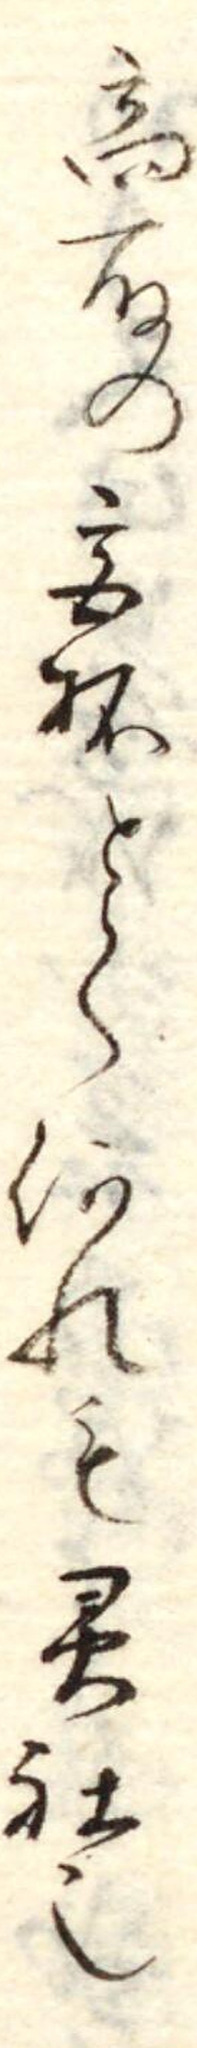高取の宮抔とて何れも霊社也
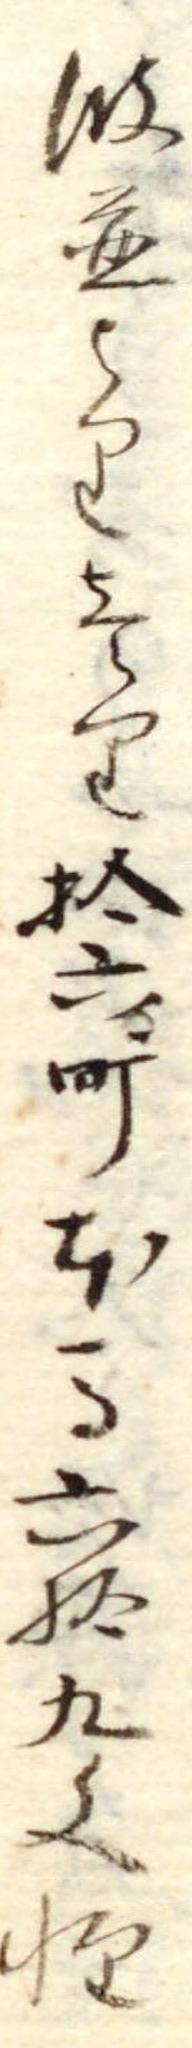波並より壱里拾六町本馬六拾九文軽
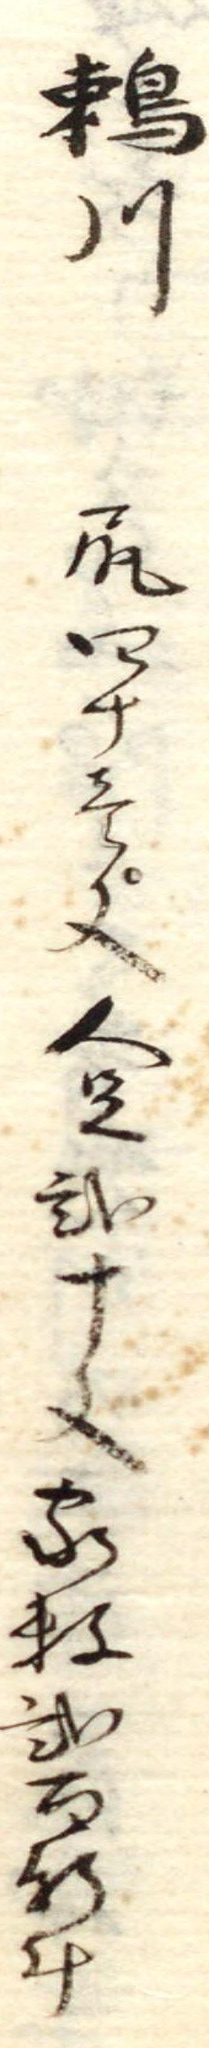鵜川尻四十壱文人足弐十文家数弐百軒斗
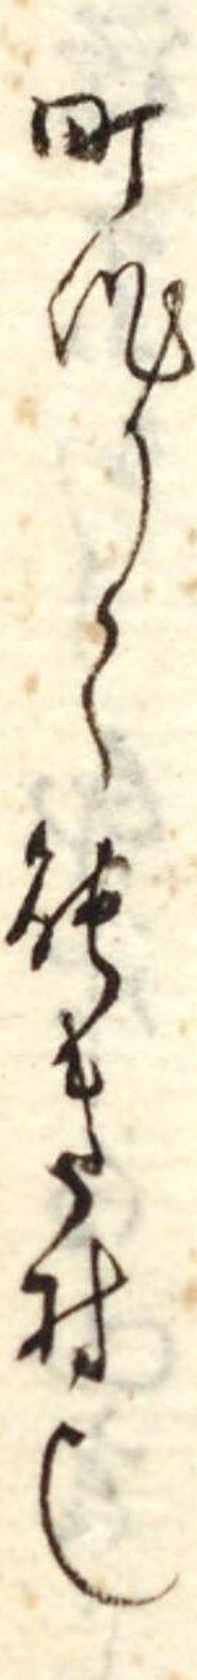町作りて能き村也
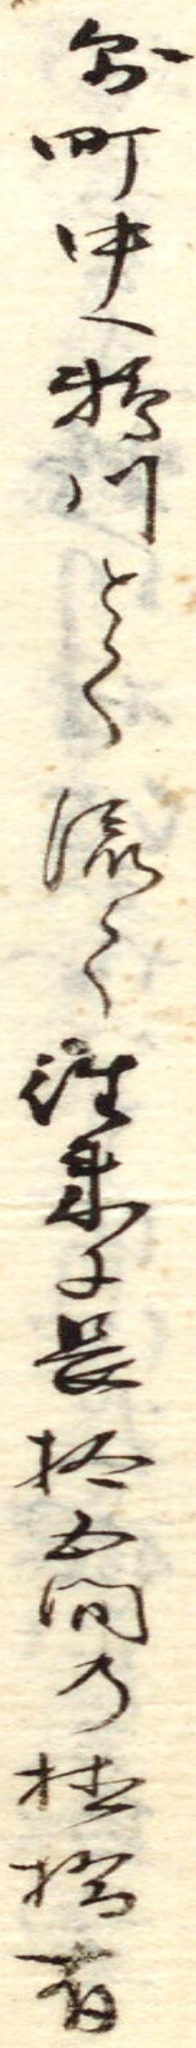則町中へ鵜川とて流て往来に長拾五間の植橋有
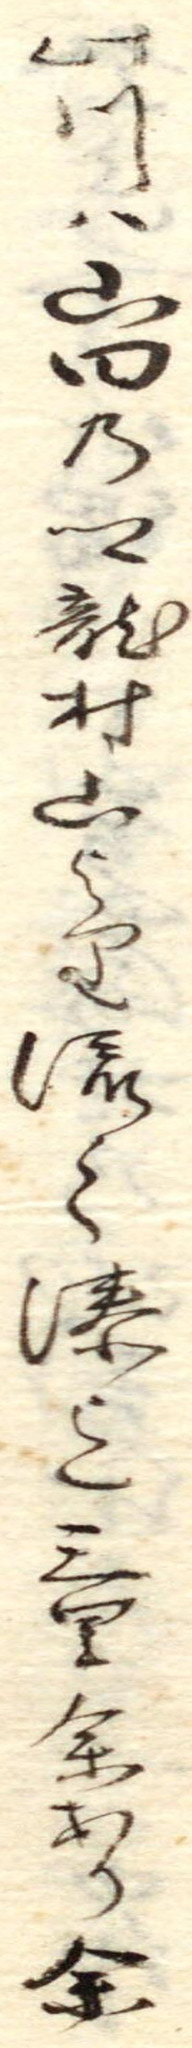此川は山田の郷龍村山より流て湊迄三里余あり余
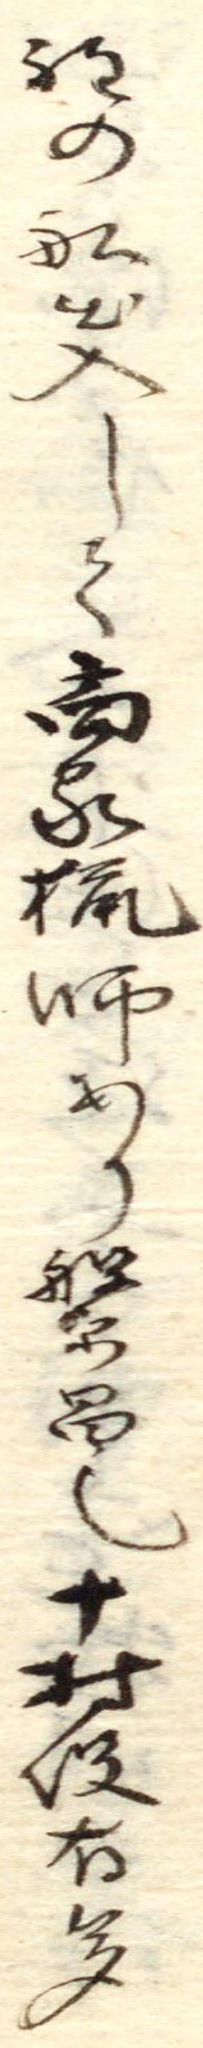程の船出入して商家猟師あり繁昌也十村役有多
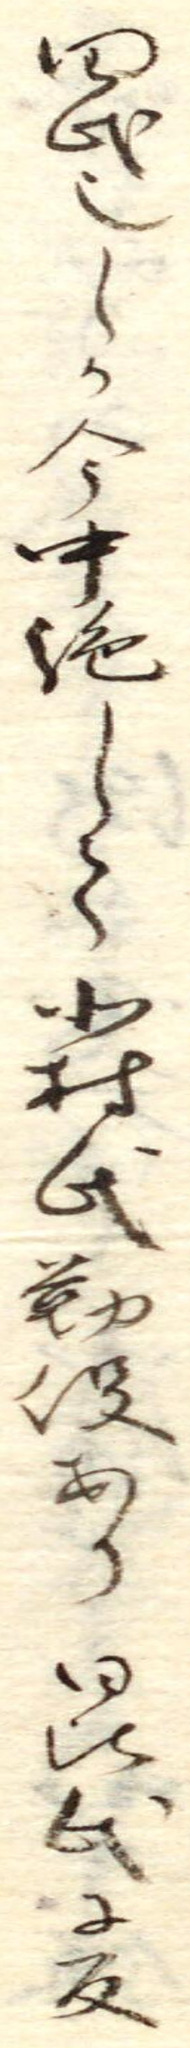田氏也しか今中絶して北村氏勤役あり日比氏に反
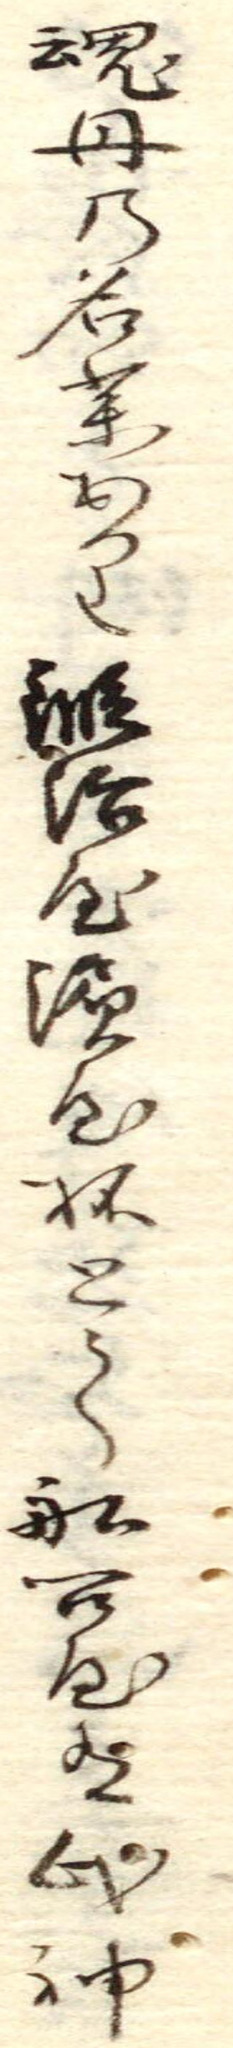魂丹の名薬あり鍛冶屋浜屋抔とて船問屋有氏神
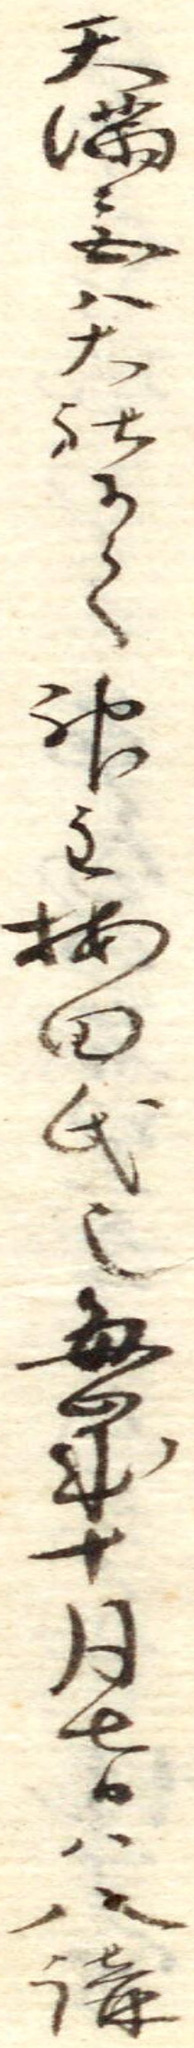天満宮は大社にて神主梅田氏也毎歳十月七日は八講
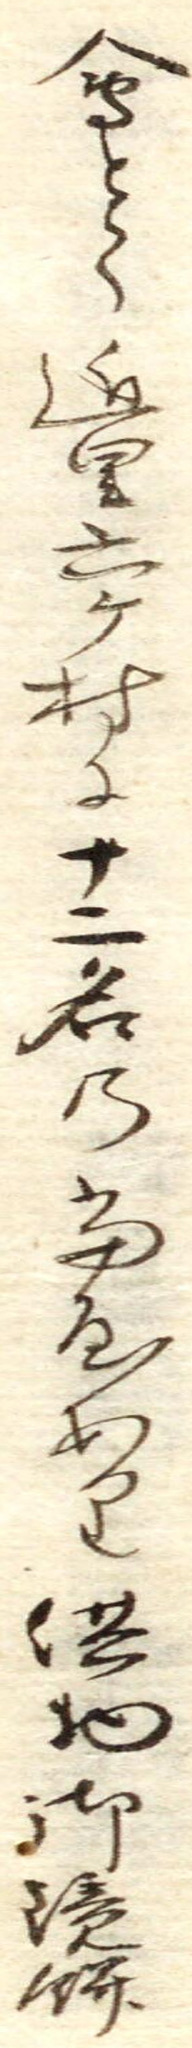会近里六ヶ村に十二名の当屋あり供物御鏡餅
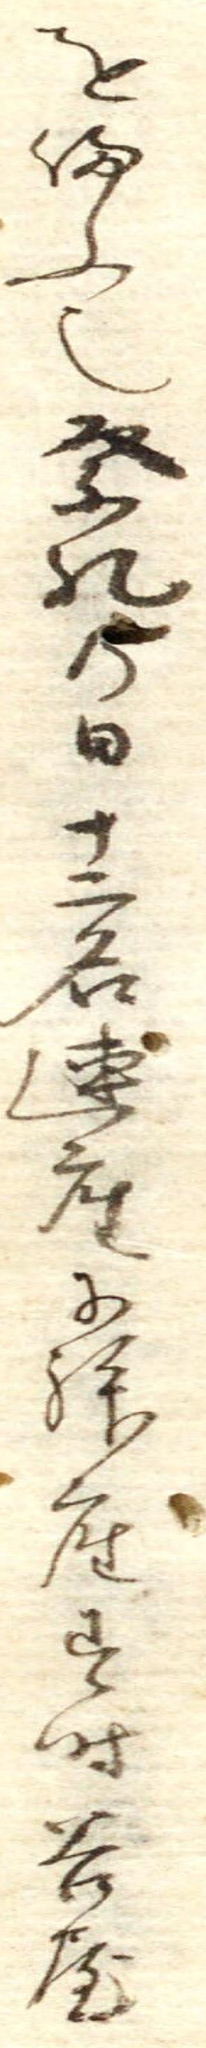を備ふ也祭礼の日十二名連座に拝座す時谷屋
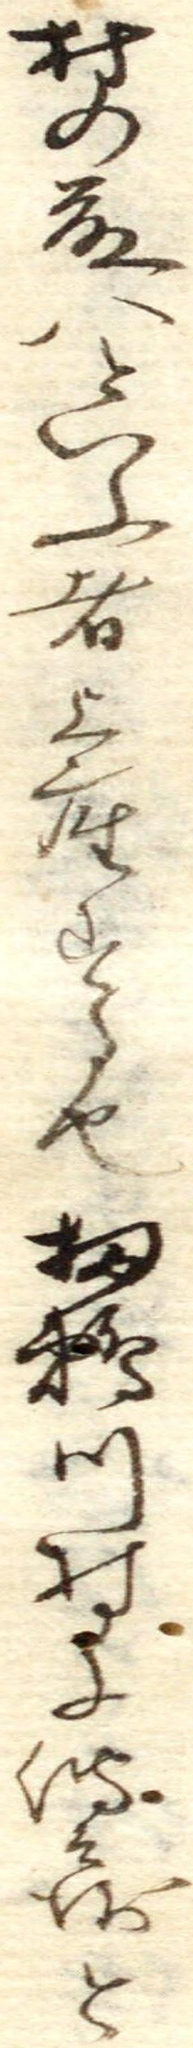村の藤八といふ者上座する也扨鵜川村に伝兵衛と

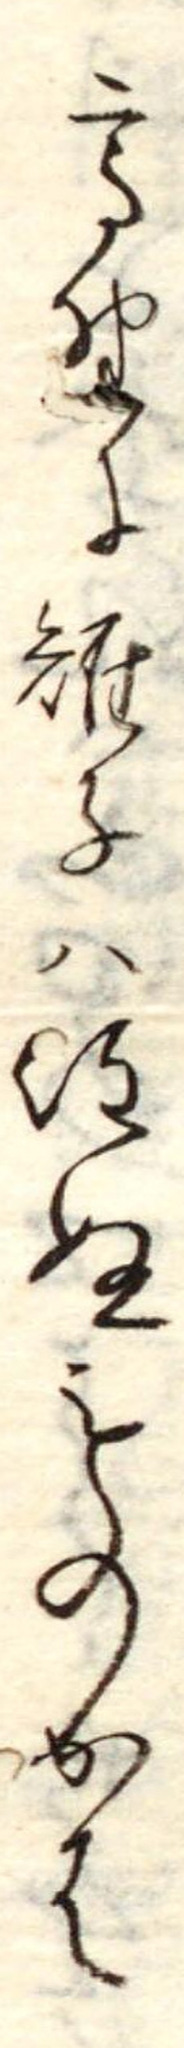高野に雉子は住ぬものかは
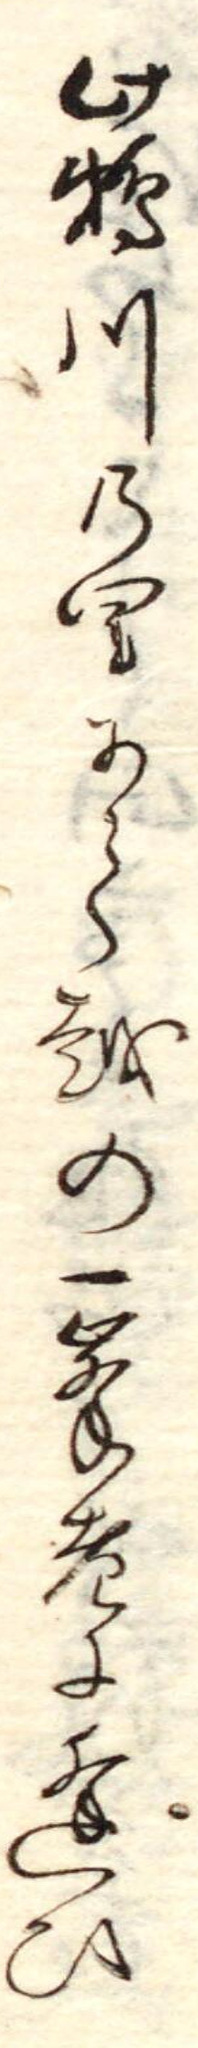此鵜川の里にて越の一峯老に逢ひ
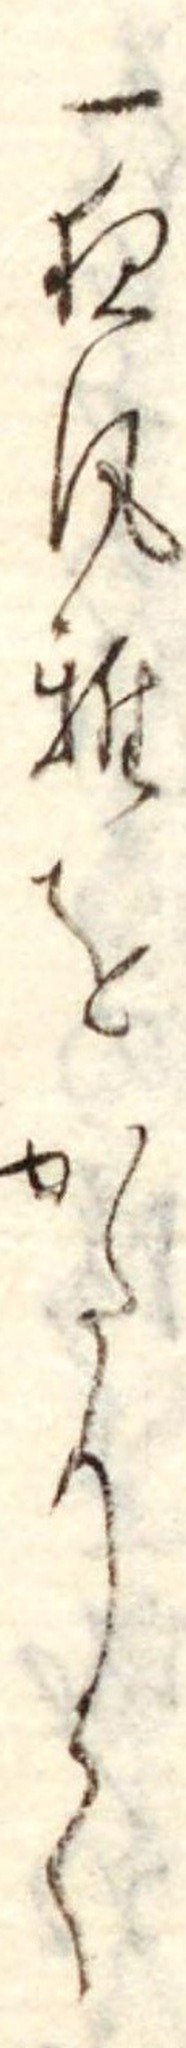一夜風雅をかたりて
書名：能登名跡誌
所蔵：Ishikawa Prefectural Library
